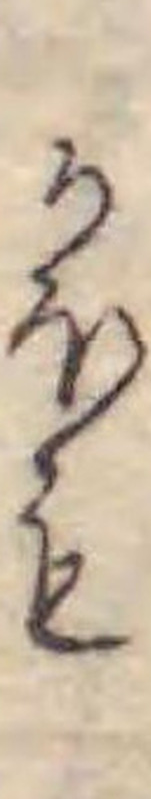かほも
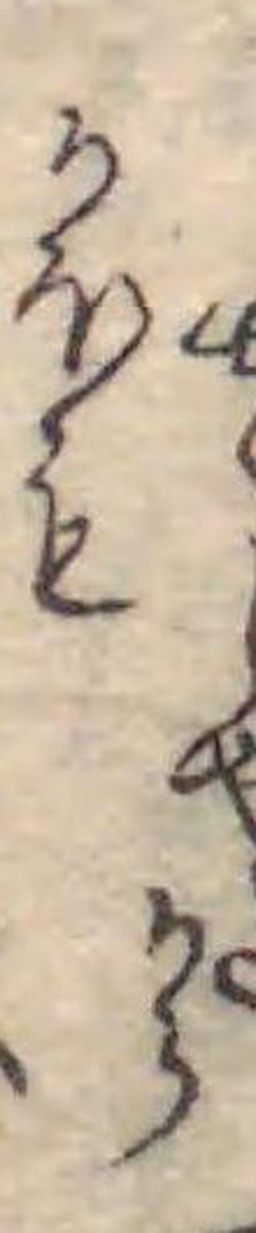かほも
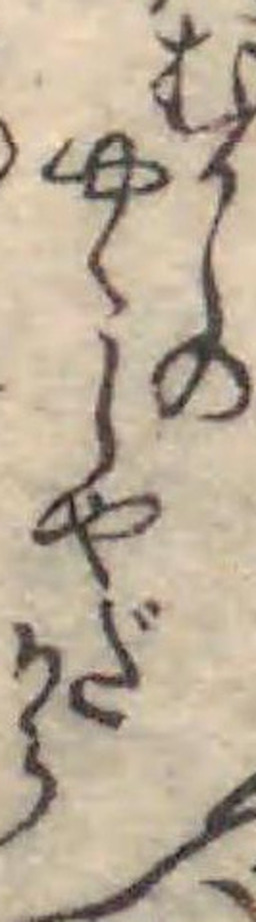やくしやだ
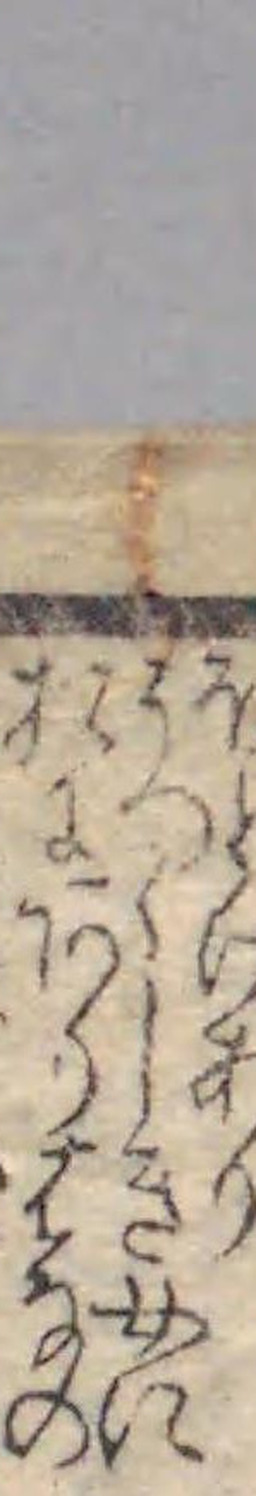おにありはなの
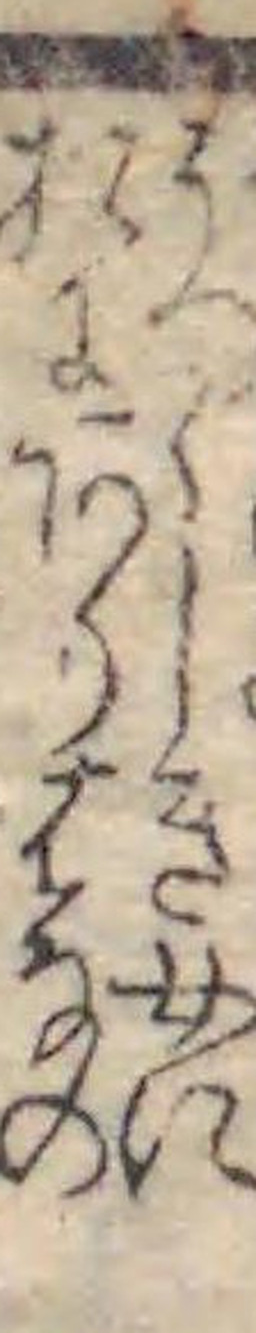おにありはなの
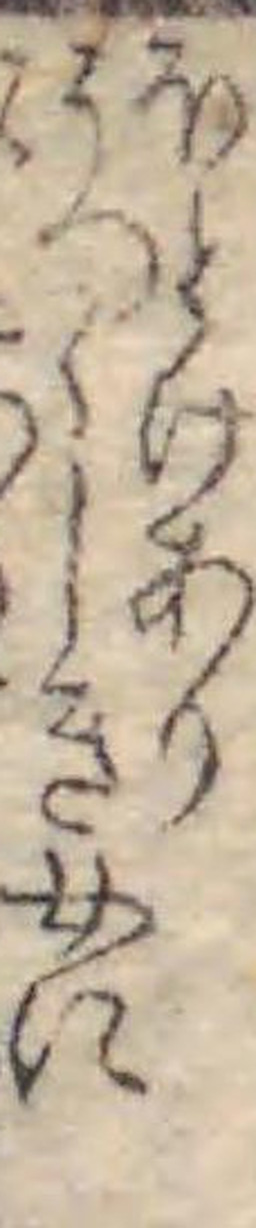うつくしき女に
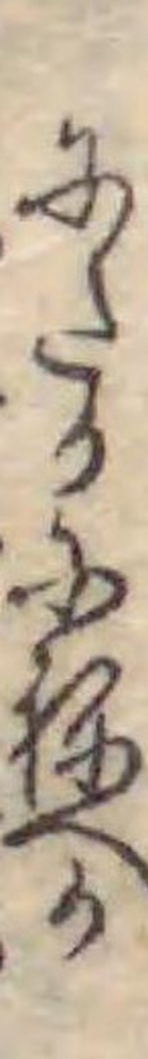にたかにねへか
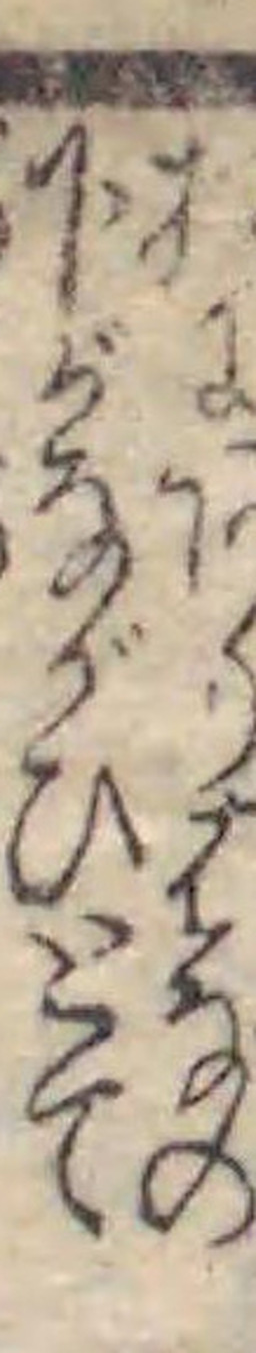下がながひとて
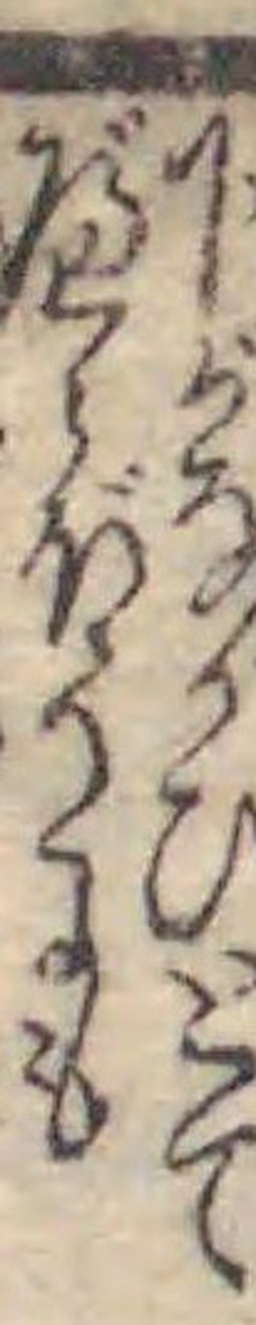べらぼうにも
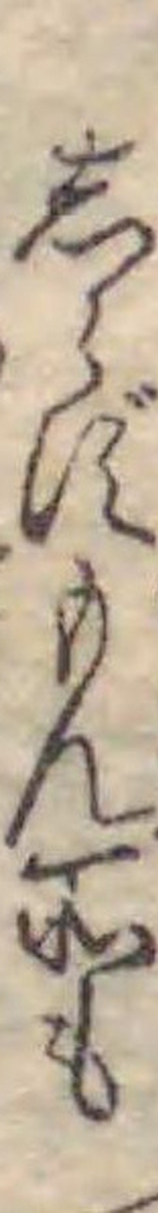しらずもん所も
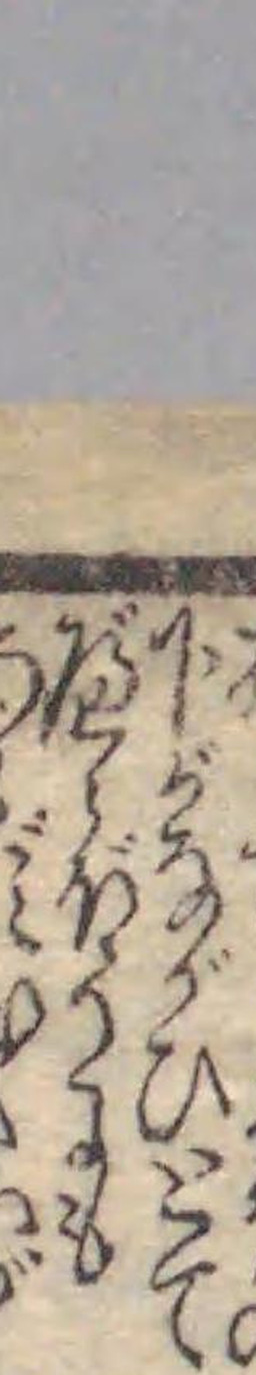べらぼうにも
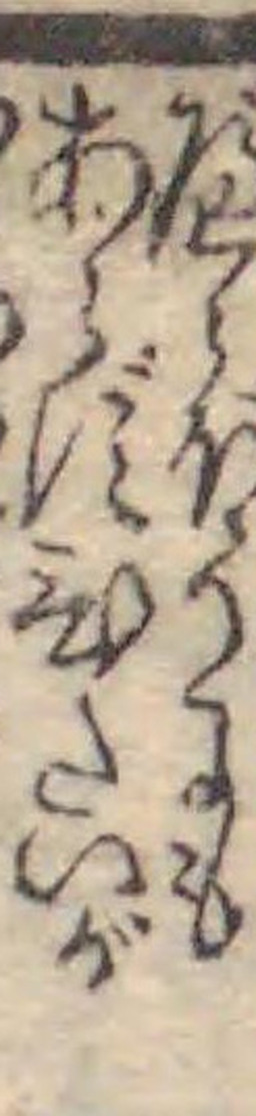あらずひたいが
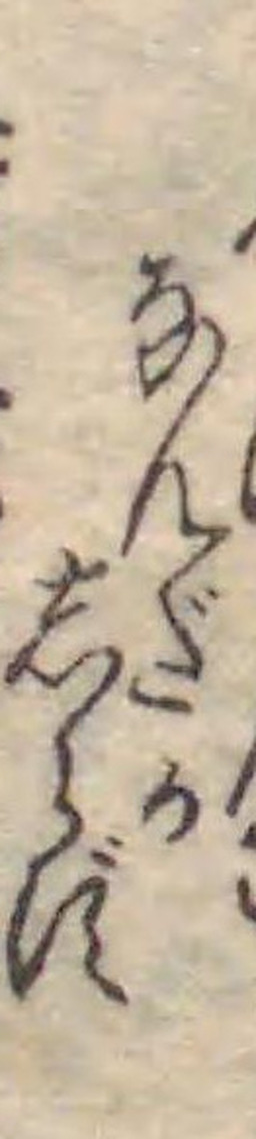しらず
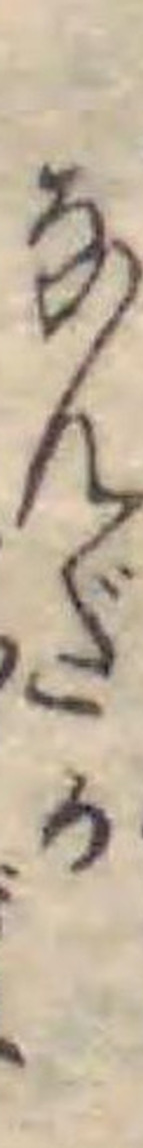なんだか
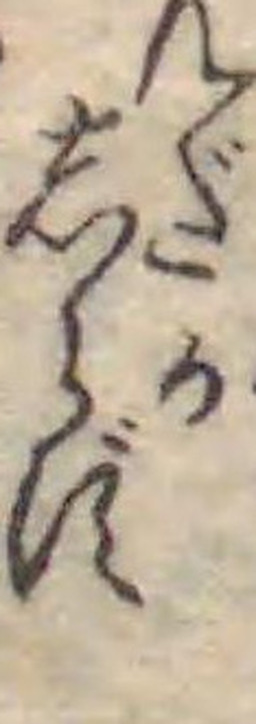しらず
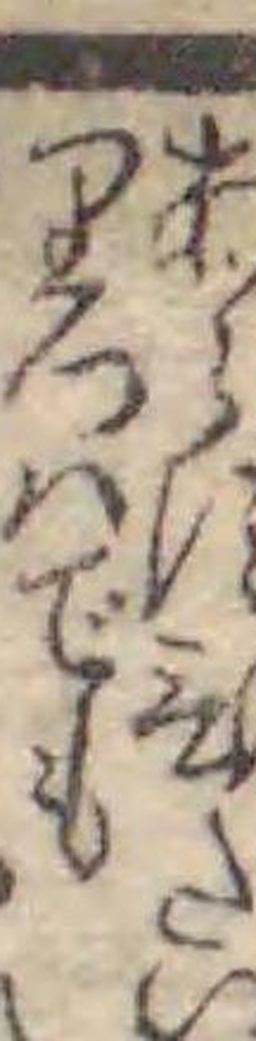りつはでも
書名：人心鏡写絵 : 3巻
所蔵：国立国会図書館 National Diet Library, JAPAN
